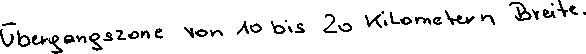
Übergangszone von 10 bis 20 Kilometern Breite.
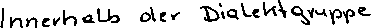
Innerhalb der Dialektgruppe
